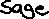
Sage
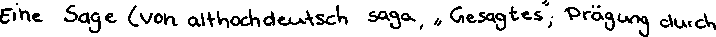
Eine Sage (von althochdeutsch saga, "Gesagtes"; Prägung durch
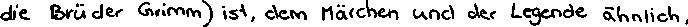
die Brüder Grimm) ist, dem Märchen und der Legende ähnlich,
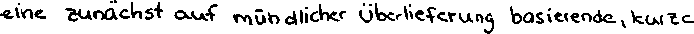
eine zunächst auf mündlicher Überlieferung basierende, kurze
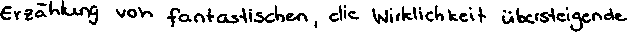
Erzählung von fantastischen, die Wirklichkeit übersteigende
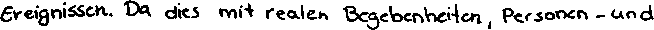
Ereignissen. Da diese mit realen Begebenheiten, Personen- und
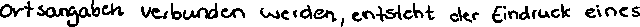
Ortsangaben verbun den werden, entsteht der Eindruck eines
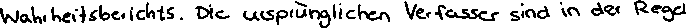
Wahrheitsberichts. Die ursprünglichen Verfasser sind in der Regel
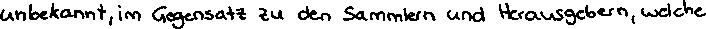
unbekannt, im Gegensatz zu den Sammlern und Herausgebern, welche
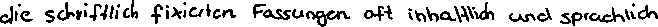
die schriftlich fixierten Fassungen oft inhaltlich und sprachlich
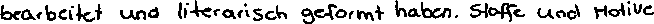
bearbeitet und literarisch geformt haben. Stoffe und Motive
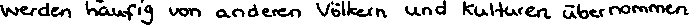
werden häufig von anderen Völkern und Kulturen übernommen
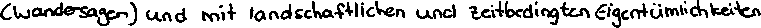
(Wandersagen) und mit landschaftlichen und zeitbedingten Eigentümlichkeiten
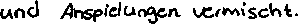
Und Anspielungen vermischt.
